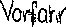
Vorfahr
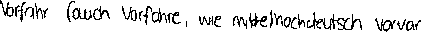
Vorfahr (auch Vorfahre; wie mittelhochdeutsch vorvar
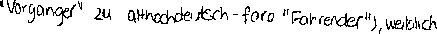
"Vorgänger" zu althochdeutsch -faro "Fahrender"), weiblich
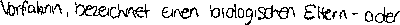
Vorfahrin, bezeichnet einen biologischen Eltern- oder
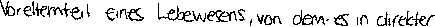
Vorelternteil eines Lebewesens, von dem es in direkter
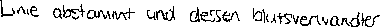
Linie abstammt und dessen blutsverwandter
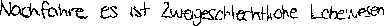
Nachfahre es ist. Zweigeschlechtliche Lebewesen
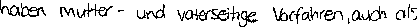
haben mutter- und vaterseitige Vorfahren, auch als
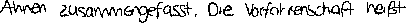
Ahnen zusammengefasst. Die Vorfahrenschaft heißt
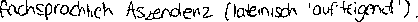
achsprachlich Aszendenz (lateinisch "aufsteigend"),
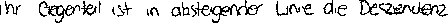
ihr Gegenteil ist in absteigender Linie die Deszendenz
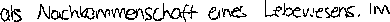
als Nachkommenschaft eines Lebewesens. Im
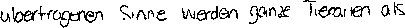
übertragenen Sinne werden ganze Tierarten als
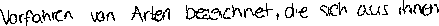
Vorfahren von Arten bezeichnet, die sich aus ihnen
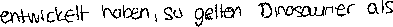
entwickelt haben, so gelten Dinosaurier als
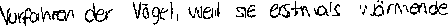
Vorfahren der Vögel, weil sie erstmals wärmende
